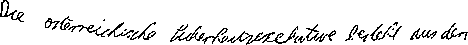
Die österreichische Sicherheitsexekutive besteht aus den
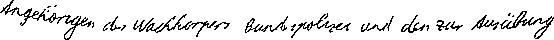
Angehörigen des Wachkörpers Bundespolizei und den zur Ausübung
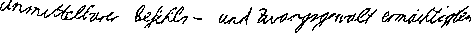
unmittelbarer Befehls- und Zwangsgewalt ermächtigten
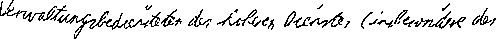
Verwaltungsbediensteten des höheren Dienstes (insbesondere des
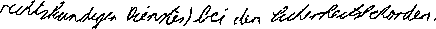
rechtskundigen Dienstes) bei den Sicherheitsbehörden.
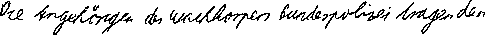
Die Angehörigen des Wachkörpers Bundespolizei tragen den
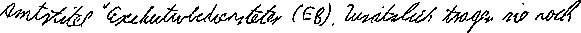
Amtstitel Exekutivbediensteter (EB). Zusätzlich tragen sie noch
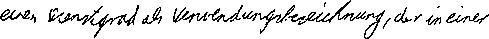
einen Dienstgrad als Verwendungsbezeichnung, der in einer
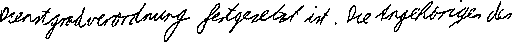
Dienstgradverordnung festgesetzt ist. Die Angehörigen des
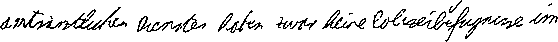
amtsärztlichen Dienstes haben zwar keine Polizeibefugnisse im
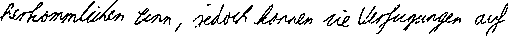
herkömmlichen Sinn, jedoch können sie Verfügungen auf
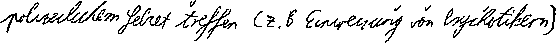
Polizeilichem Gebiet treffen (z. B. Einweisung von Psychotikern)
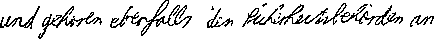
und gehören ebenfalls den Sicherheitsbehörden an
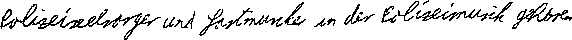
Polizeiseelsorger und Gastmusiker in der Polizeimusik gehören
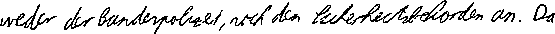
weder der Bundespolizei, noch den Sicherheitsbehörden an. Da
